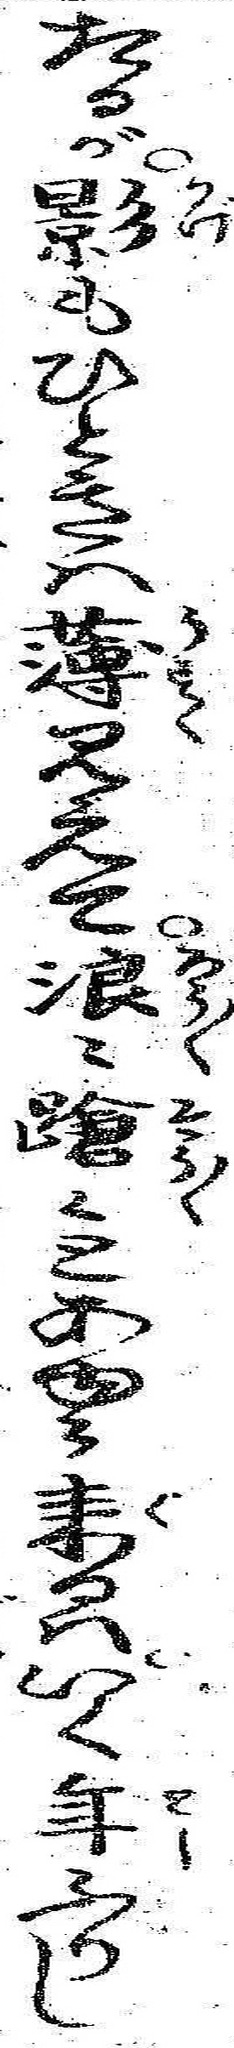たるが。影もひときは薄見えて。浪々蹌々とあゆみ来るは。いく年ふりし
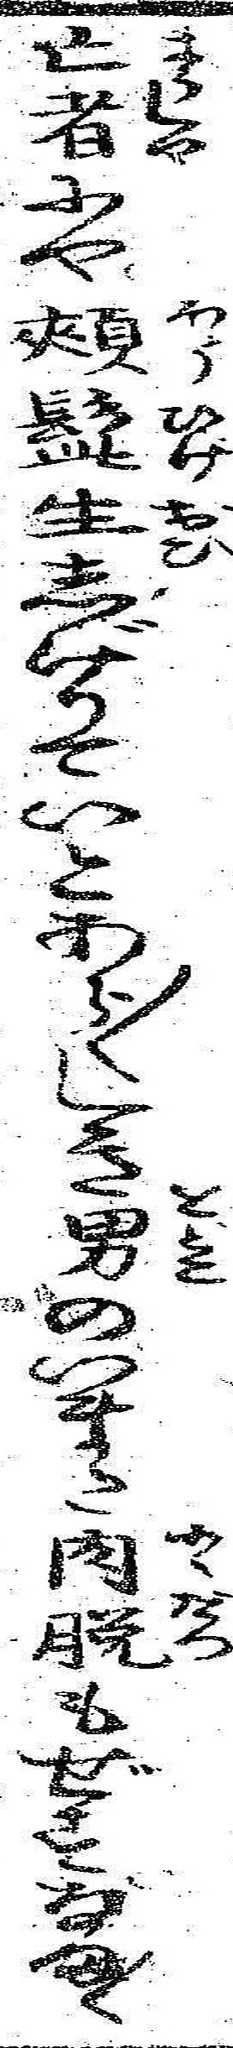亡者にや。頬髭生しげりていとあら〳〵しき男のいまた肉脱もぜす。なま〳〵
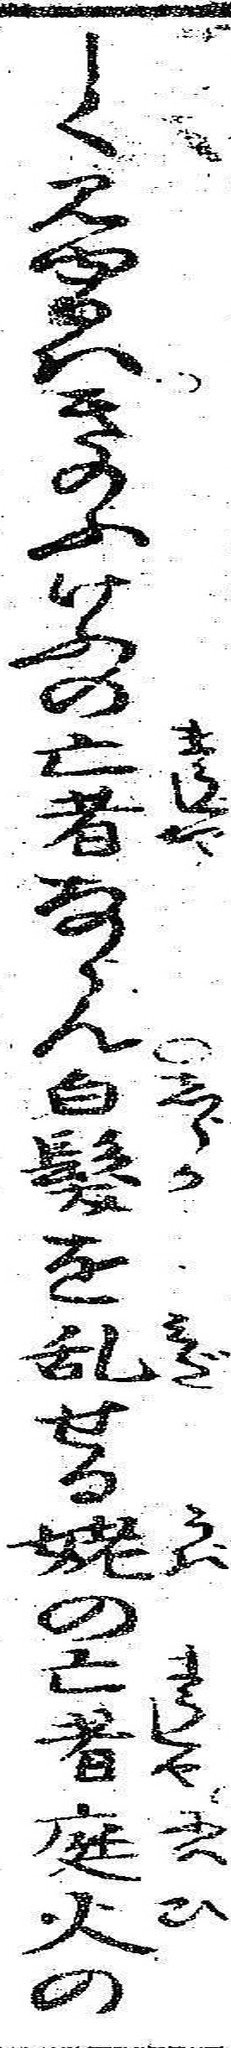しく見ゆるは。きのふけふの亡者ならん。白髪を乱せる姥の亡者。庭火の
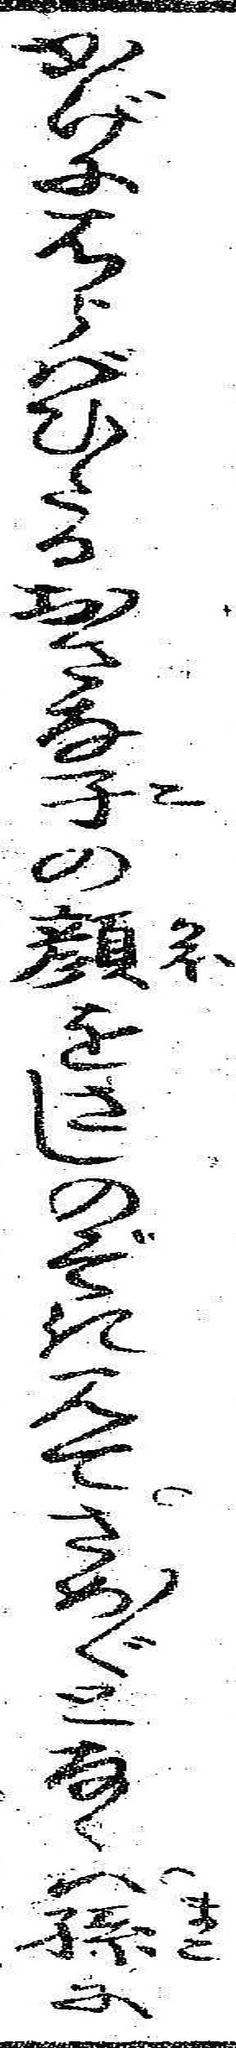かげにはらばひたるおさな子の顔をさしのぞき見て。さめ〴〵となくは。孫に
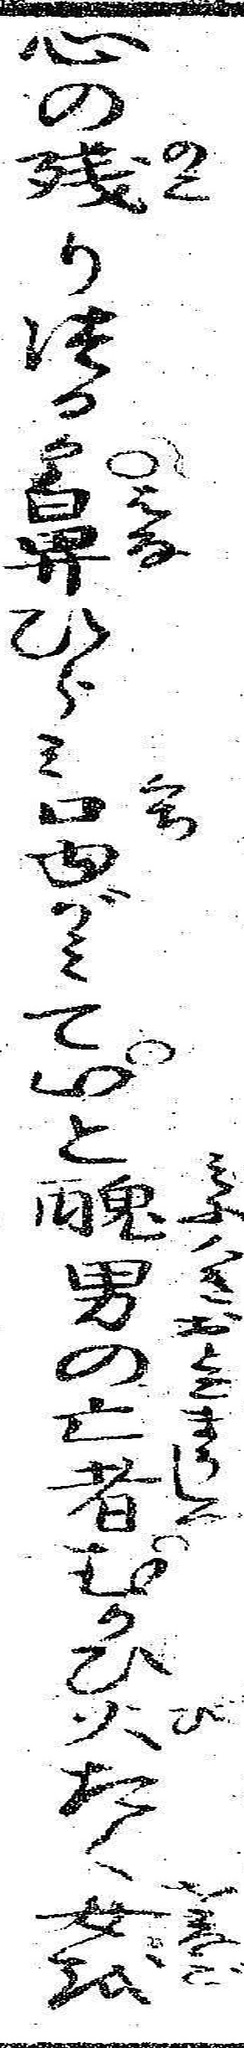心の残りつるか。鼻ひらみ口ゆがみて。いと醜男の亡者。むかひ火たく女を
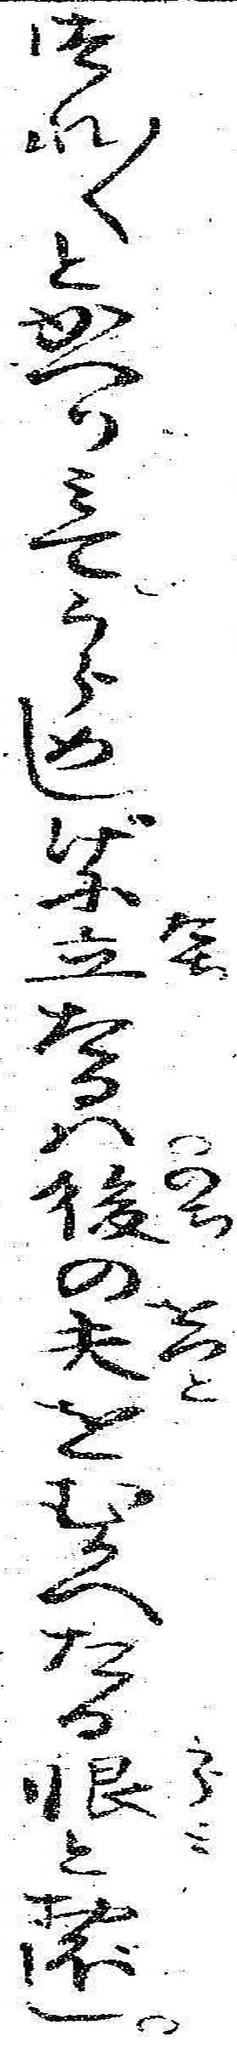つれ〳〵とかへりみて。うらしめげに立たるは。後の夫をむかへたる恨とおぼし。
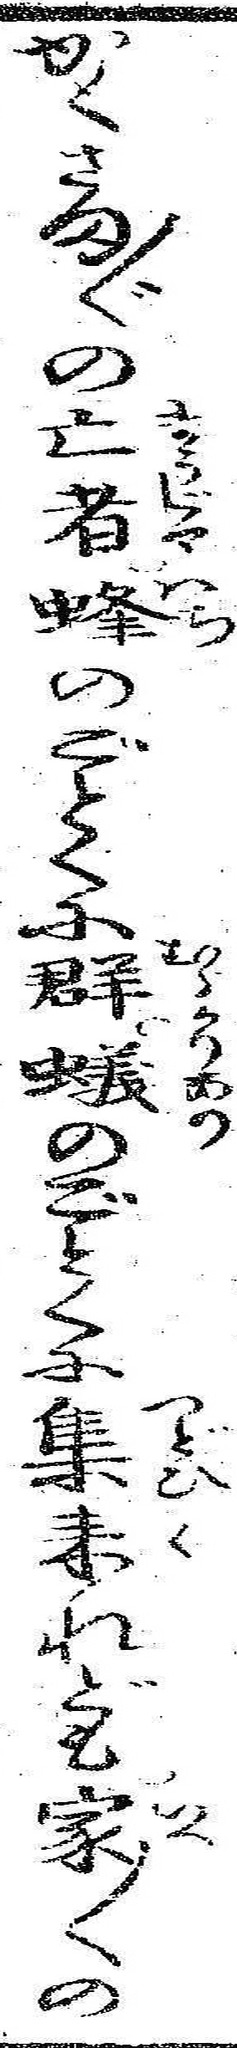かくさま〴〵の亡者。蜂のごとくに群。蟻のごとくに集来れども。家の
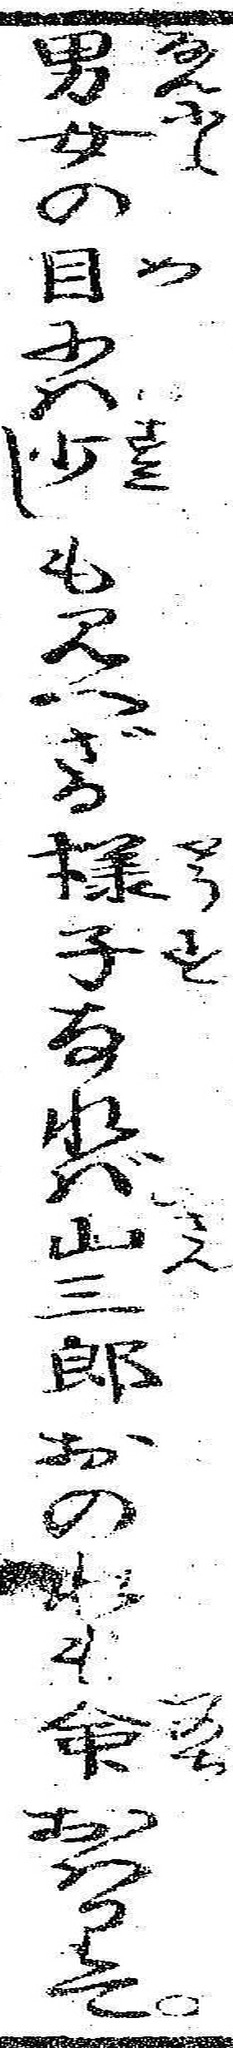男女の目には少しも見へざる様子なれば。山三郎おのれも命おはりて。
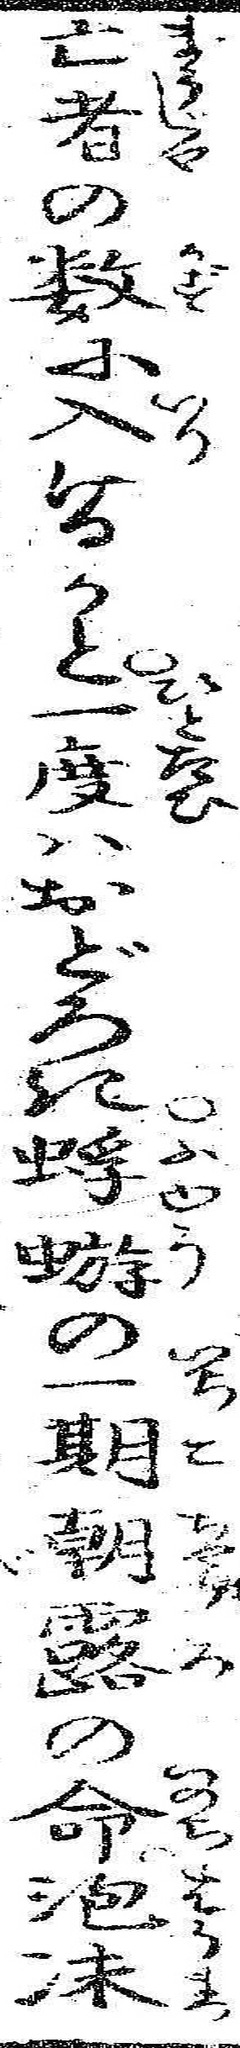亡者の数に入けるかと。一度はおどろき。蜉蝣の一期朝露の命。泡沫
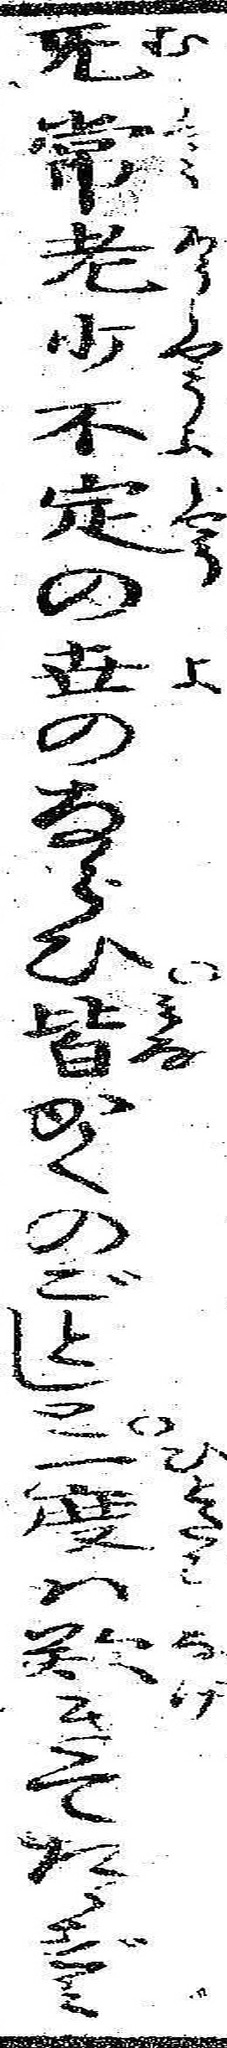無常老少不定の世のならひ。皆かくのごとしと。一度は歎きてたゝずみ
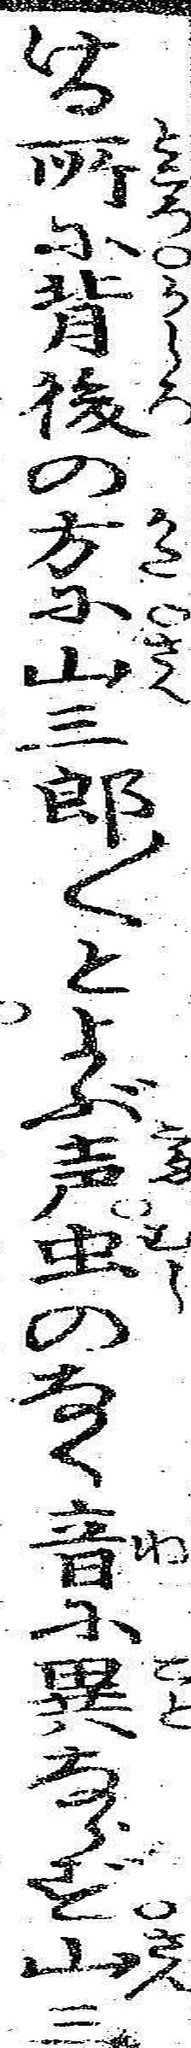ける所に。背後の方に。山三郎〳〵とよぶ声。虫のなく音に異ならず。山三
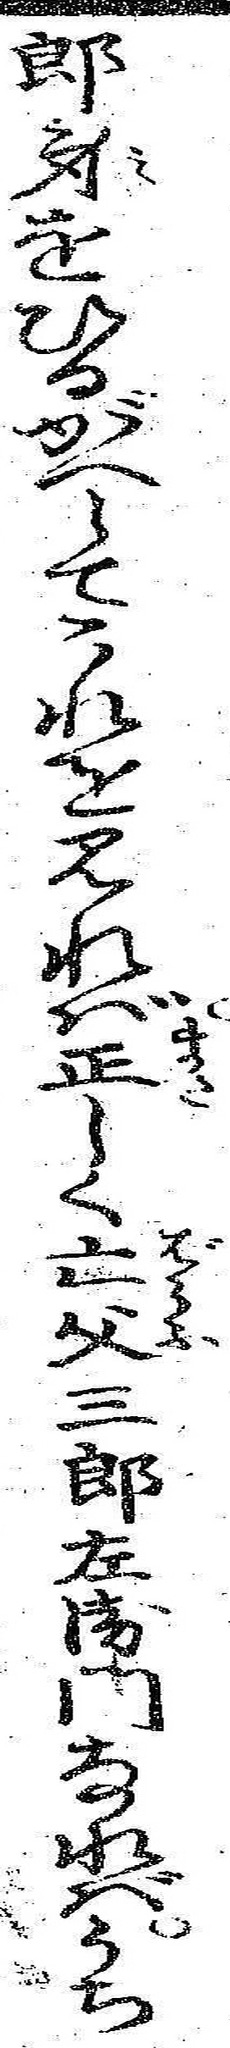郎身をひるがへしてこれを見れば。正しく亡父三郎左衛門なれば。うち
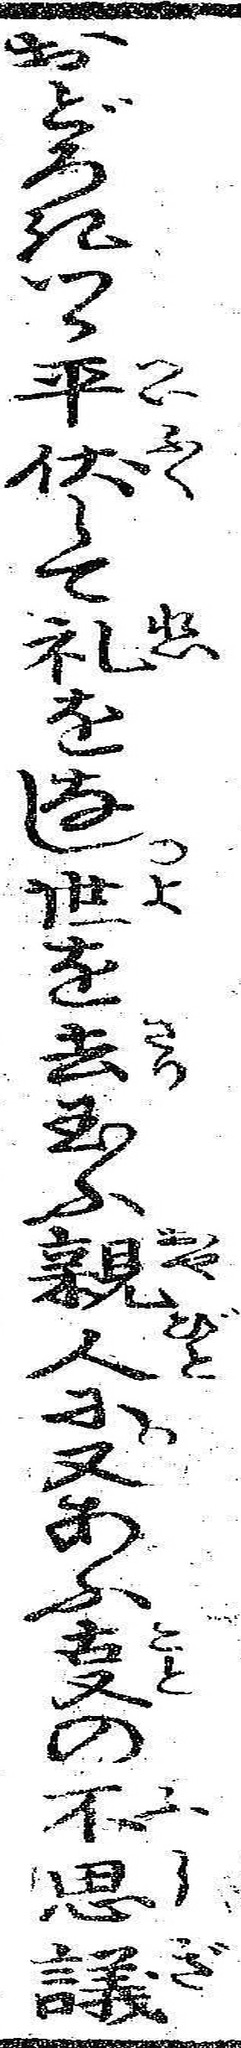おどろきつゝ平伏して礼をなし。世を去玉ふ親人に。又あふ事の不思議
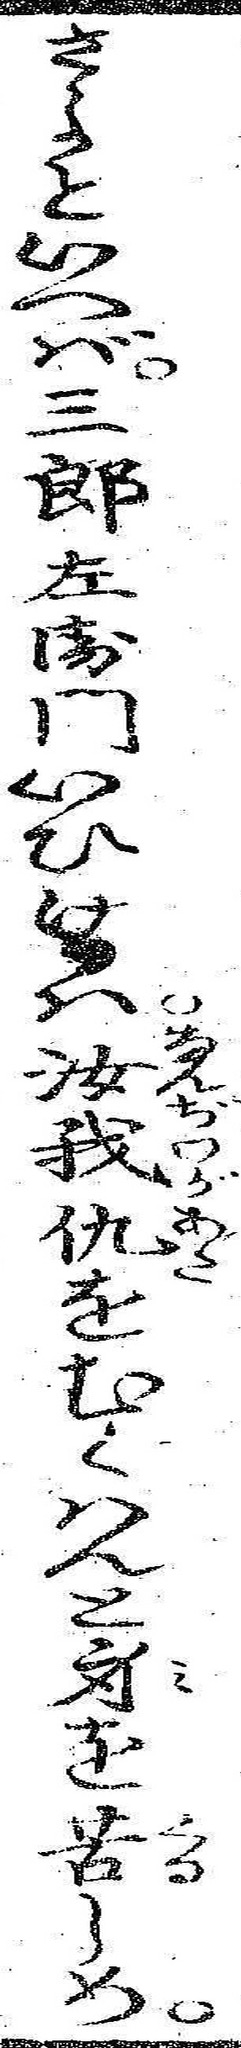さよといへば。三郎左衛門いひけるは。汝我仇をむくはんと身を苦しめ。
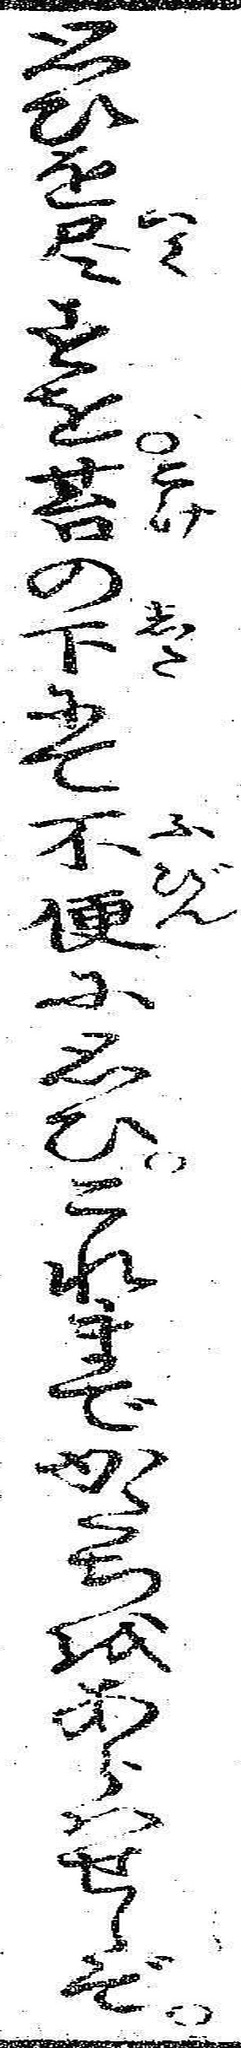思ひを尽すを。苔の下にて不便に思ひ。これまでかたちをあらはせしぞ。
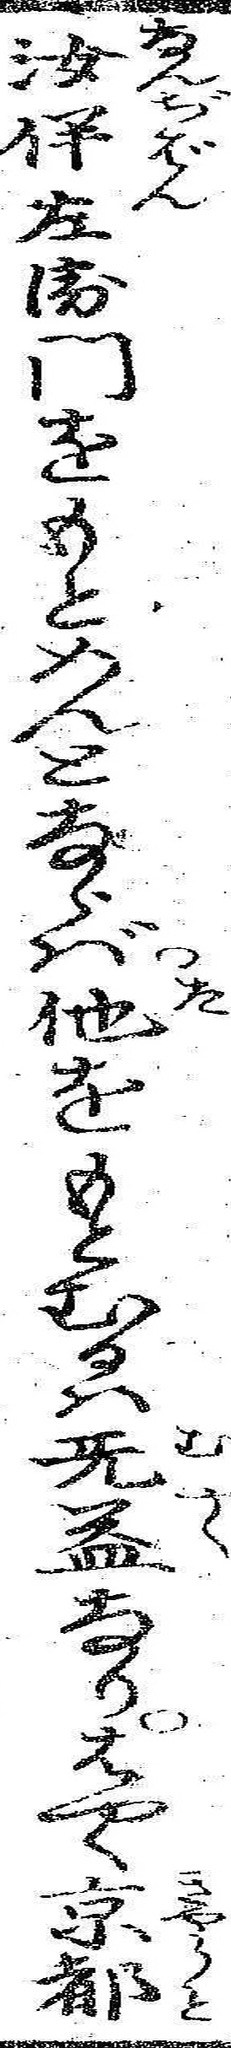汝伴左衛門をもとめんとならば。他をもとむるは無益なり。はやく京都
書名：昔話稲妻表紙
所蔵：国文学研究資料館
